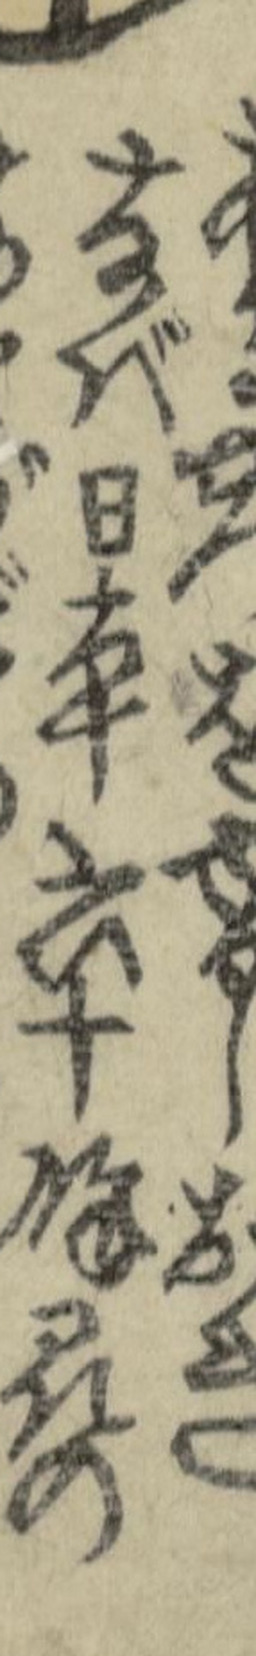なば日本六十余州の
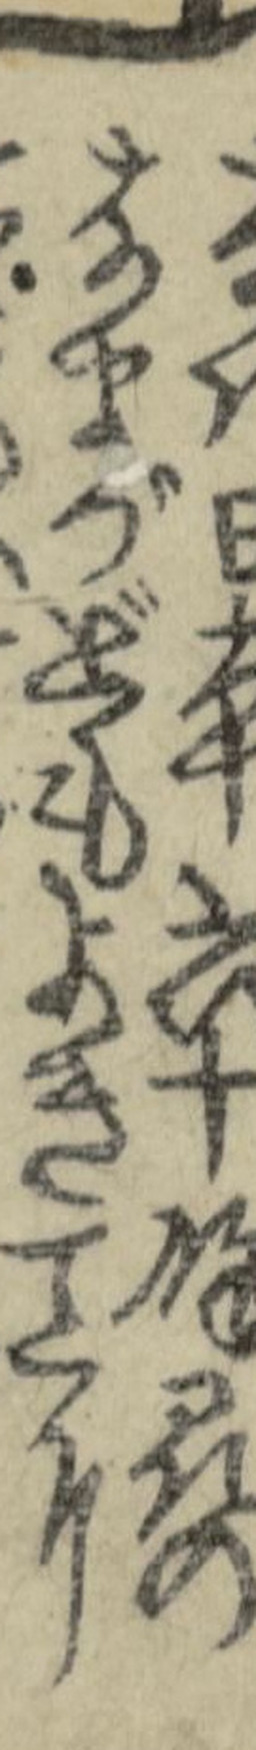なまづどもよきことに
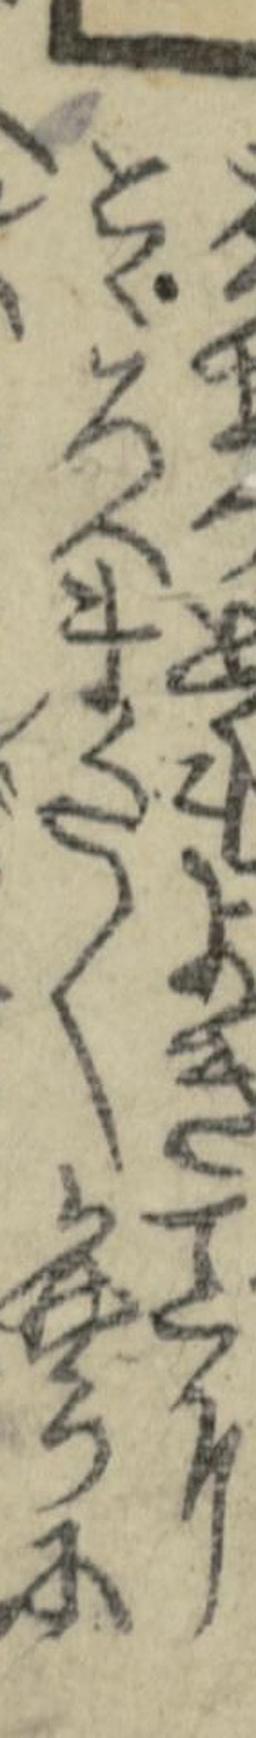こゝろへまた〳〵かやうに
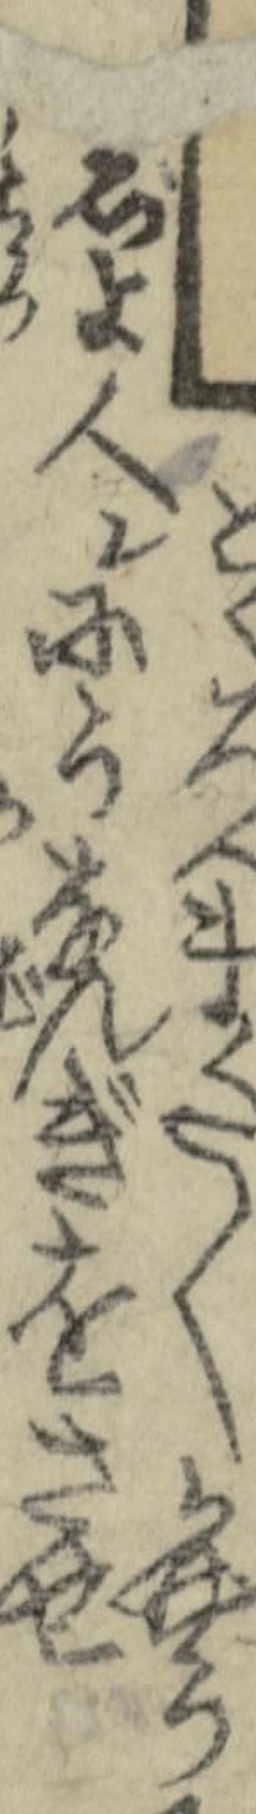しよ人ンにらなんぎをさせ
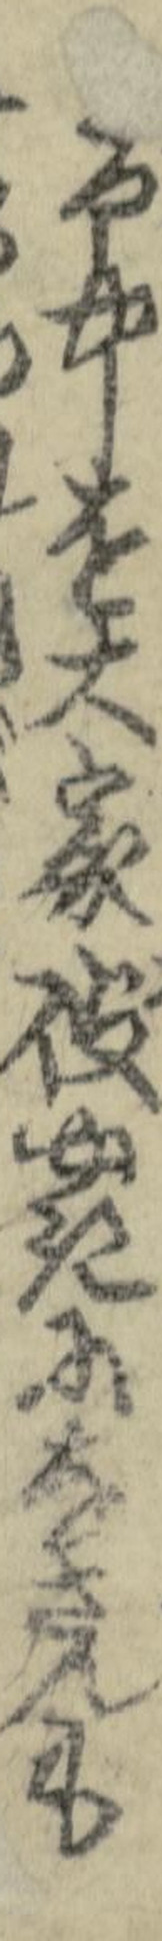市中を大家破やきになさんも
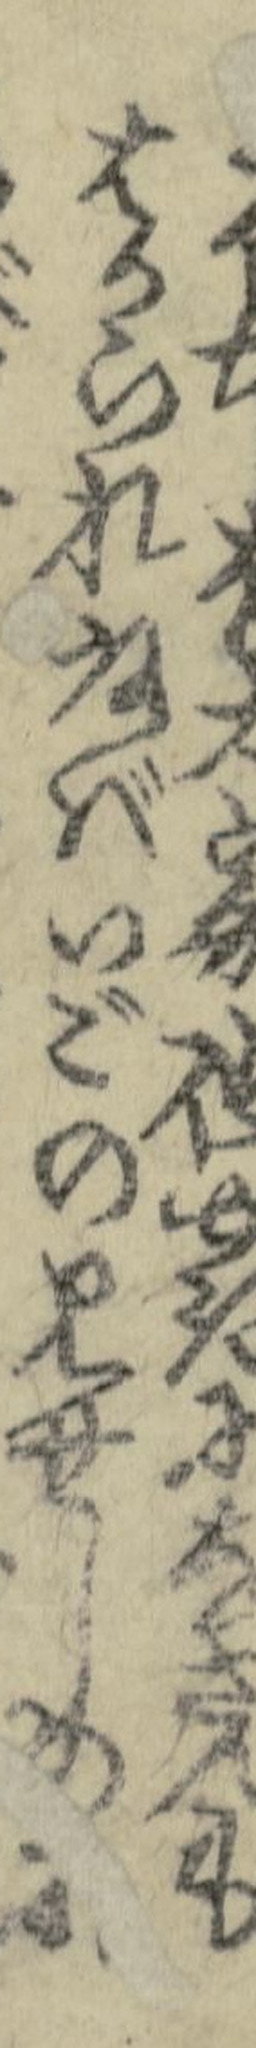はかられなばいごのみせしめに
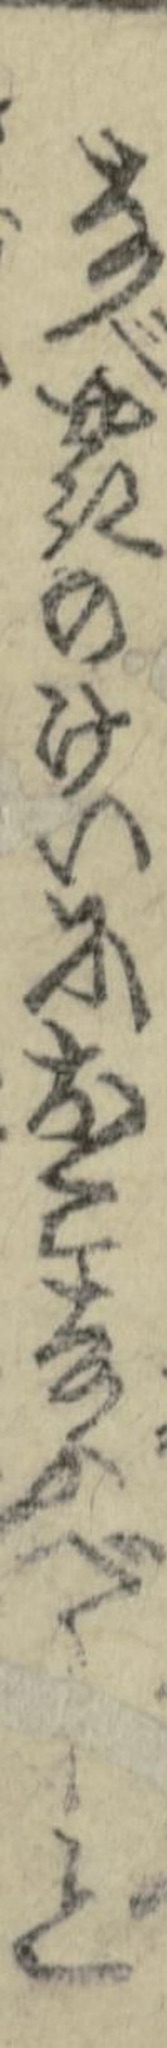なべやきのけいにおこなふべしと
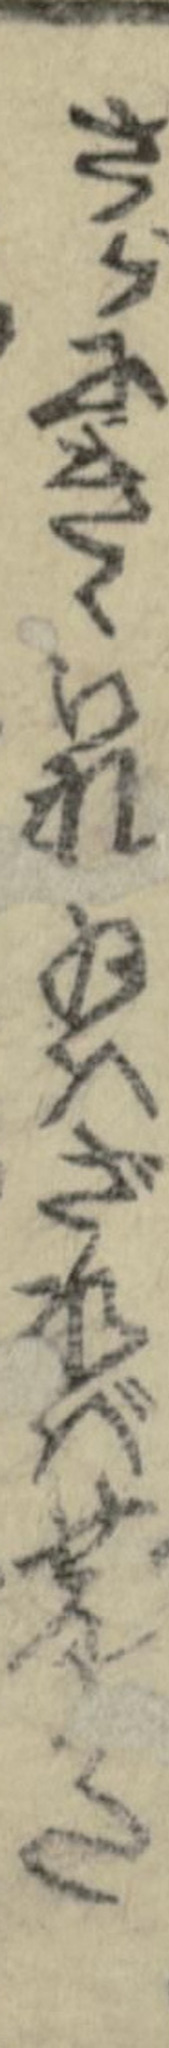さらにきゝいれぬはざればせんかた
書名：生捕ました三度の大地震
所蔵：東京大学地震研究所図書室 Earthquake Research Institute Library, The University of Tokyo, JAPAN
